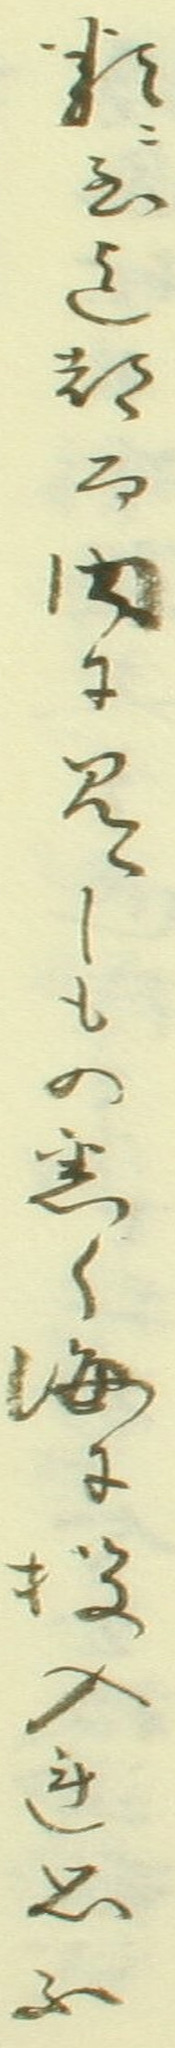類に至る迠都而内に見へしもの悉く海に投入れ思ふ
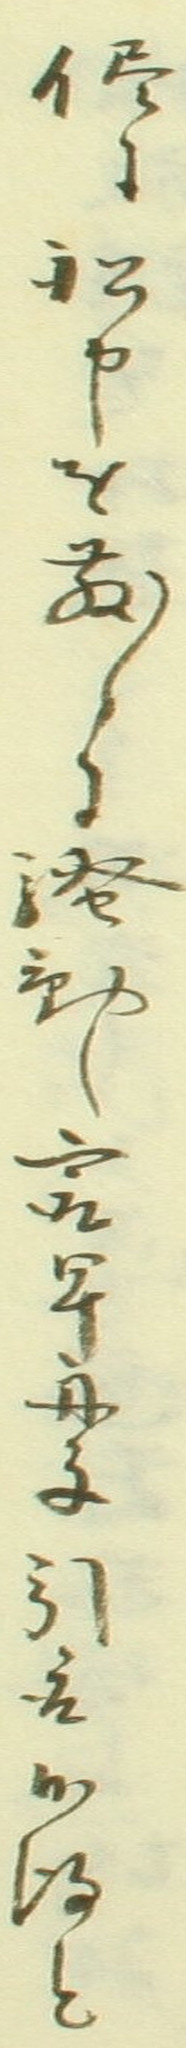侭に船中を敷りに騒動し最早舟子引取候得と
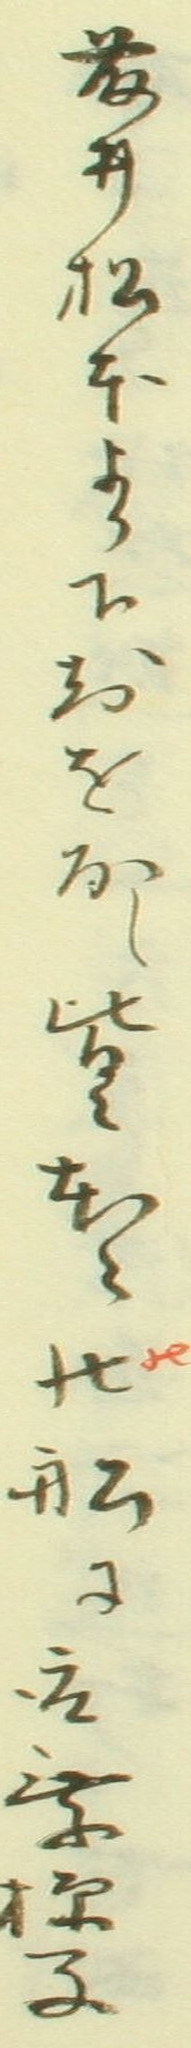藤井松本より下知をなし皆皆本本の船に取乗様子
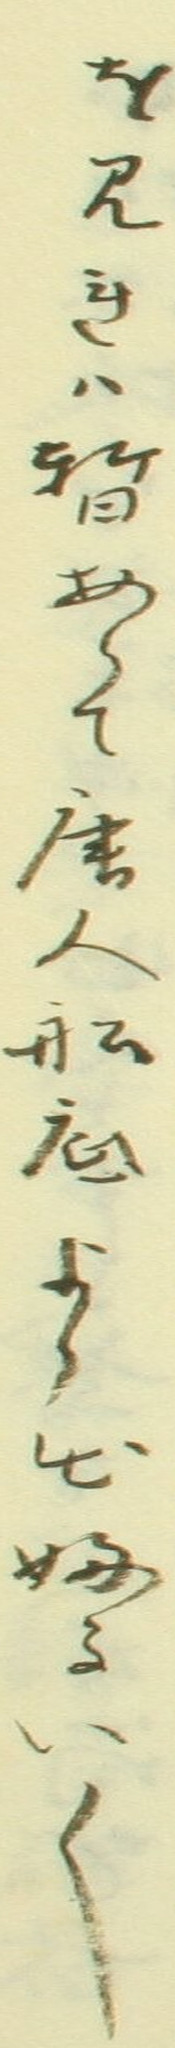を見れは暫ありて唐人船底より出婦るい出婦るい

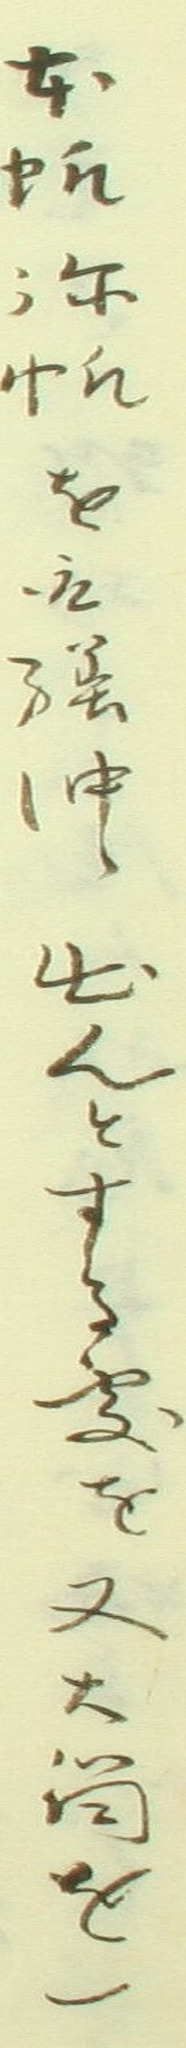本帆弥帆を取張沖へ出んとする處を又大筒を一
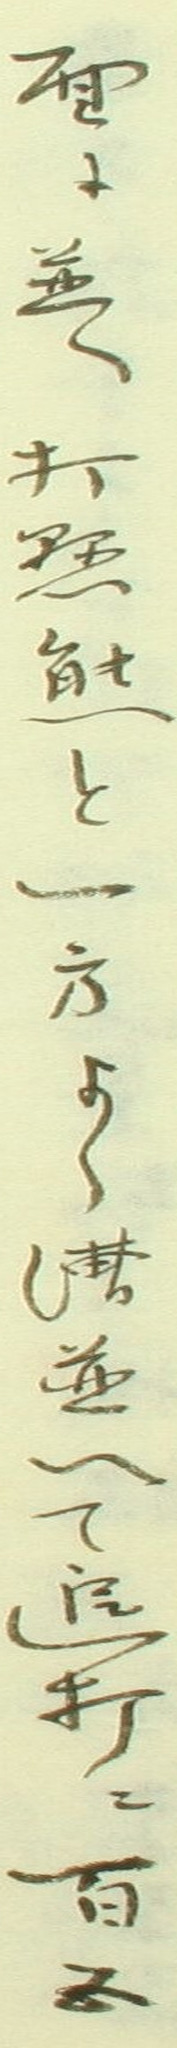面に並へ打懸態と一方より漕並へて追打に百五
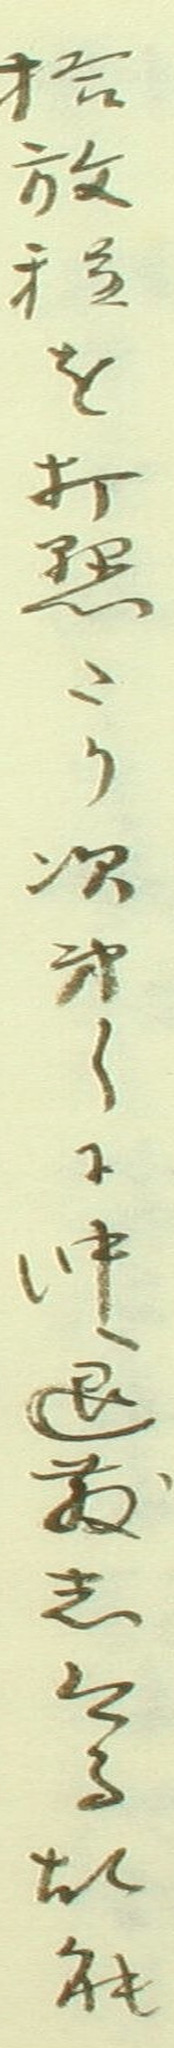拾放程を打懸たり次第次第に沖へ退敷しける故能
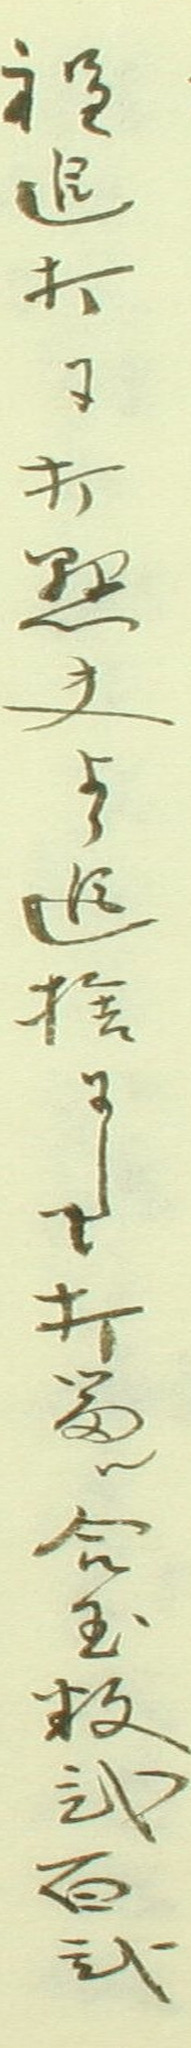程追打に打懸夫より追捨にして打留る合玉数弐百弐
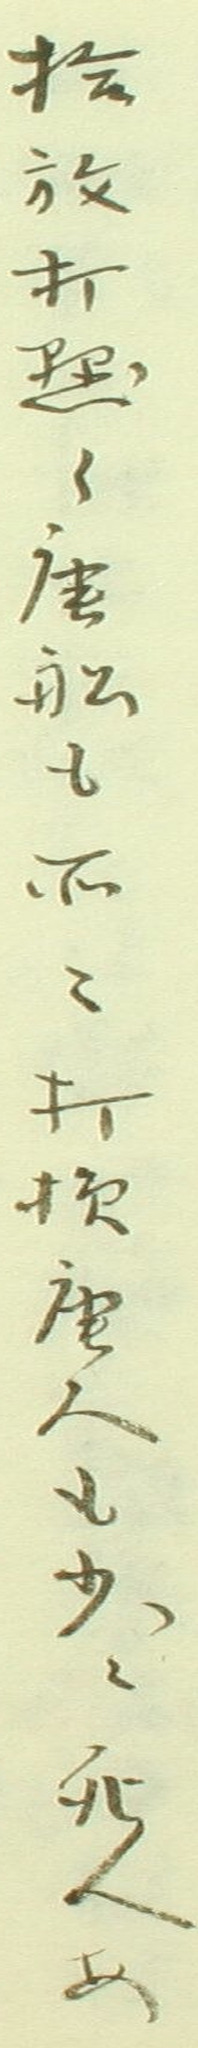拾放打懸り唐船も所々打損唐人も少々死人あ
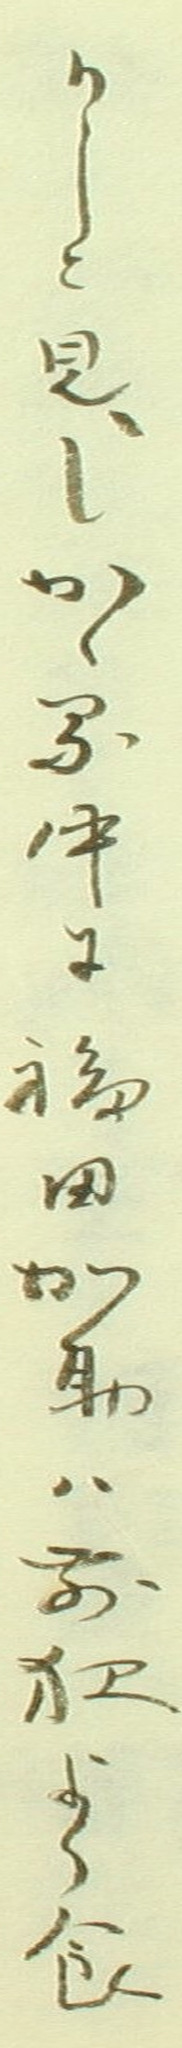りしと見へしかかる中に福田加すけは前夜より食
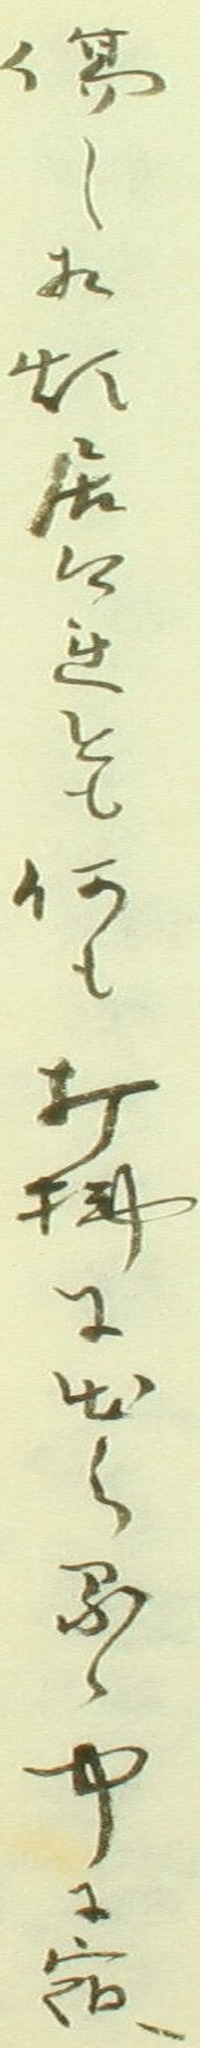傷し相煩居けれとも何も打払に出らるる中に宿へ
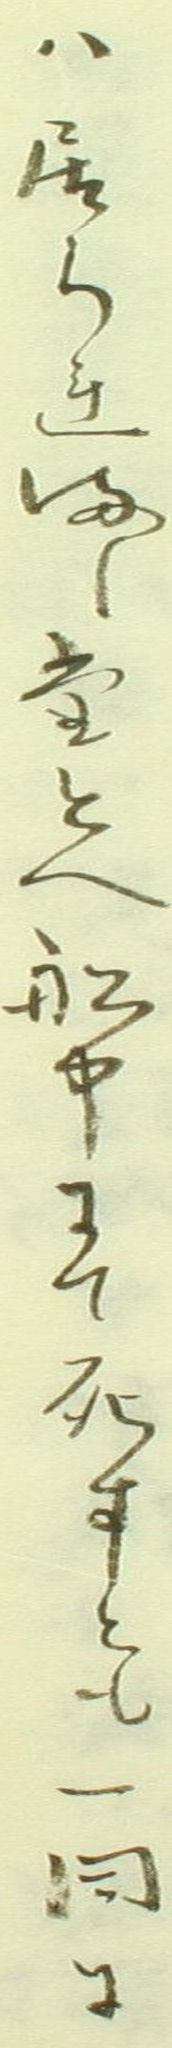は居られましたとへ船中にて死すとも一同に
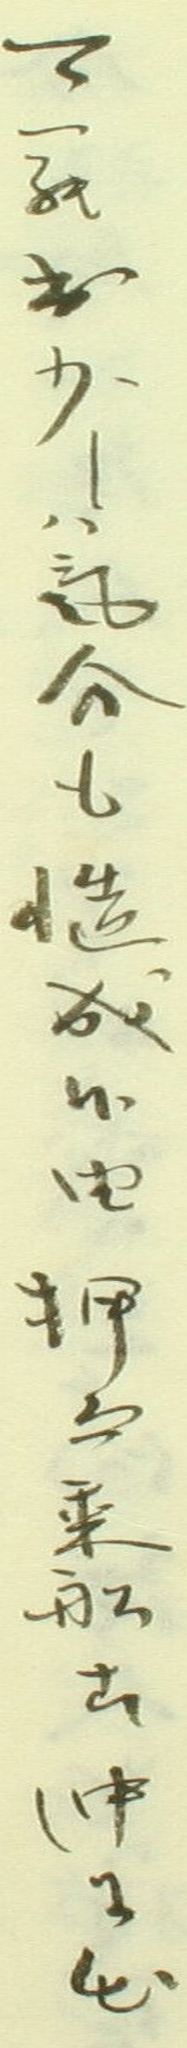可罷出少しは気分も慥成候由押而来船す沖に出
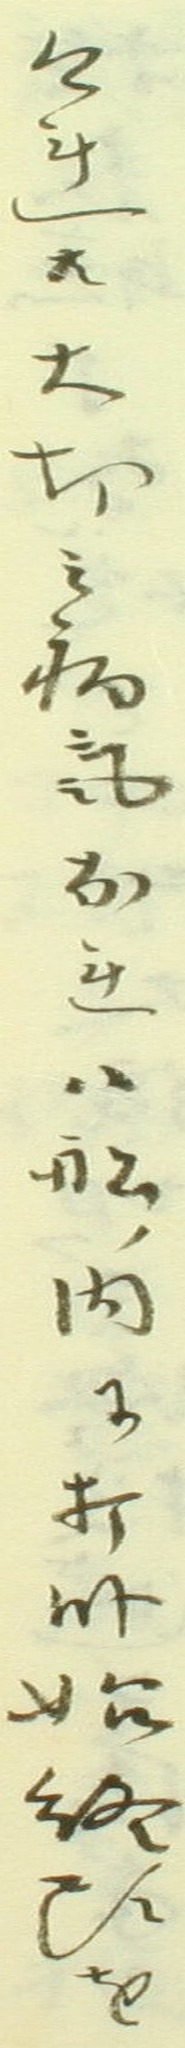けれ共大切之病気なれは船の内に打臥始終頭を
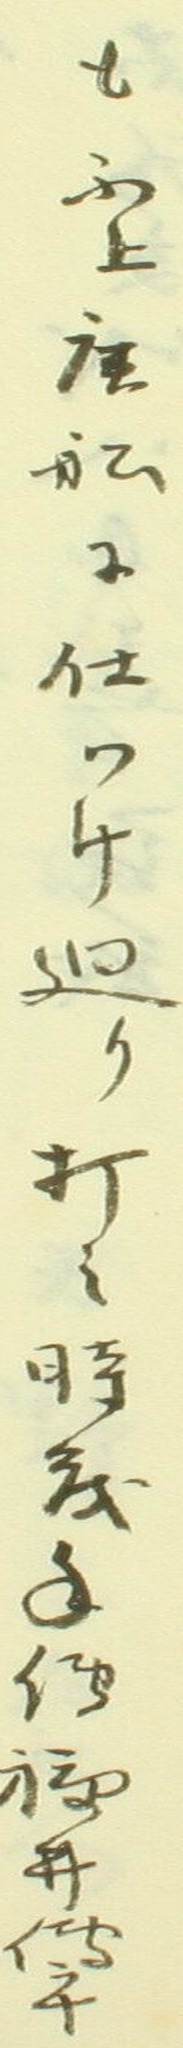も不上唐船に仕かけ廻り打之時も手伝福井伝兵
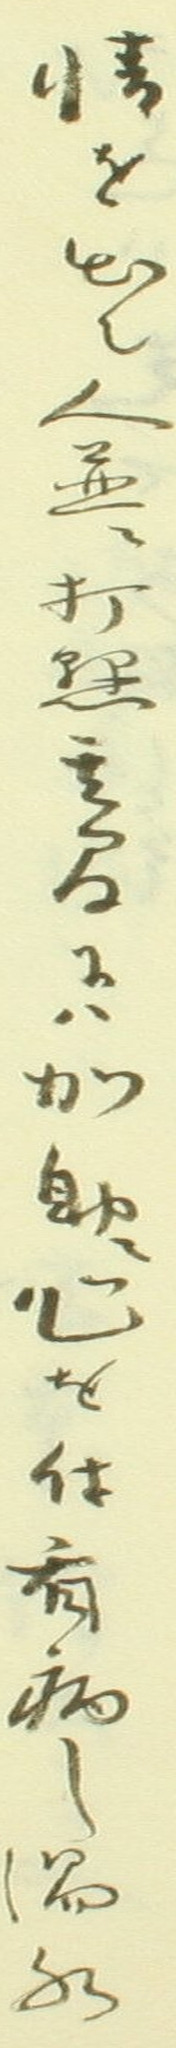衛を出し人並に打懸其間には加助に心を付有病し潟水
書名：唐船漂流記 三
